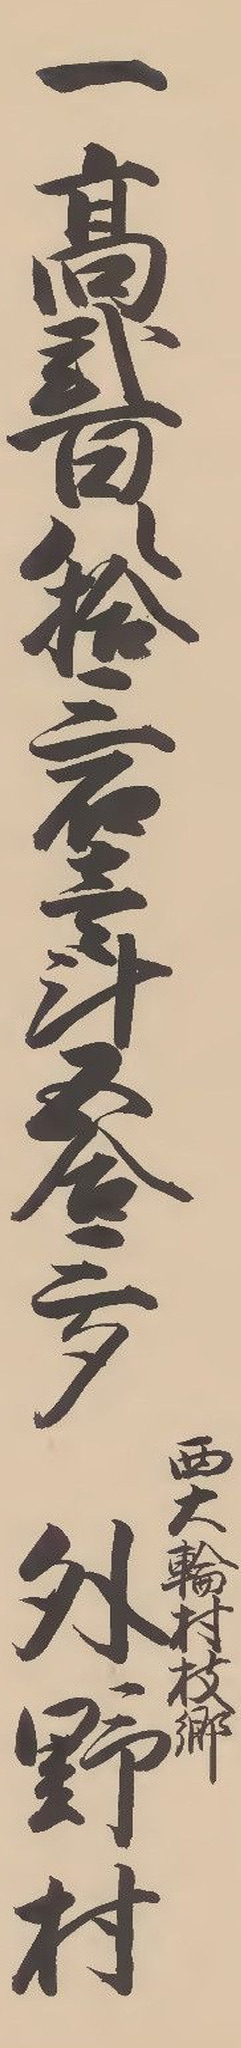一高弐百八拾三石壱斗五合三勺外野村
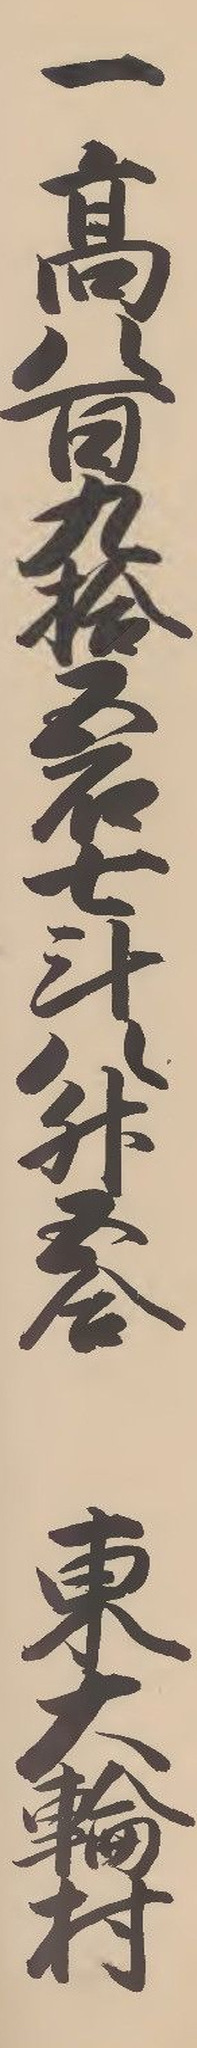一高八百九拾五石七斗八升五合東大輪村
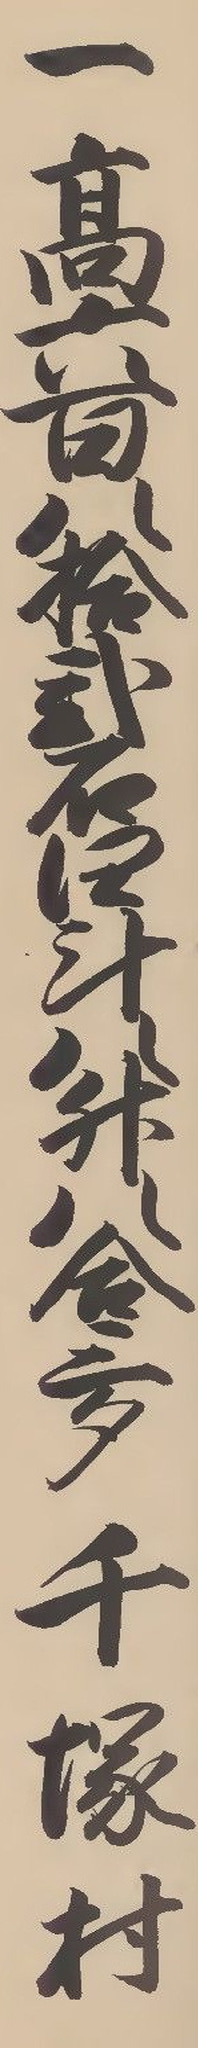一高六百八拾弐石四斗八升八合三勺千塚村
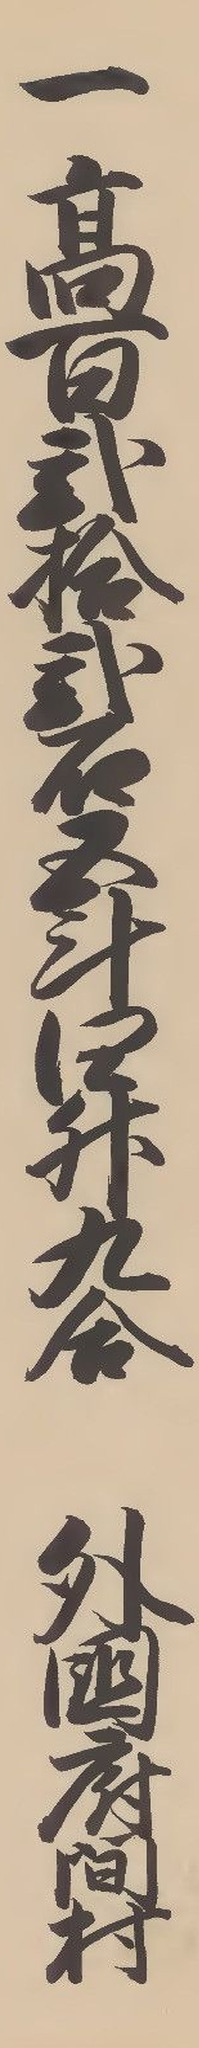一高百弐拾弐石五斗四升九合外国府間村
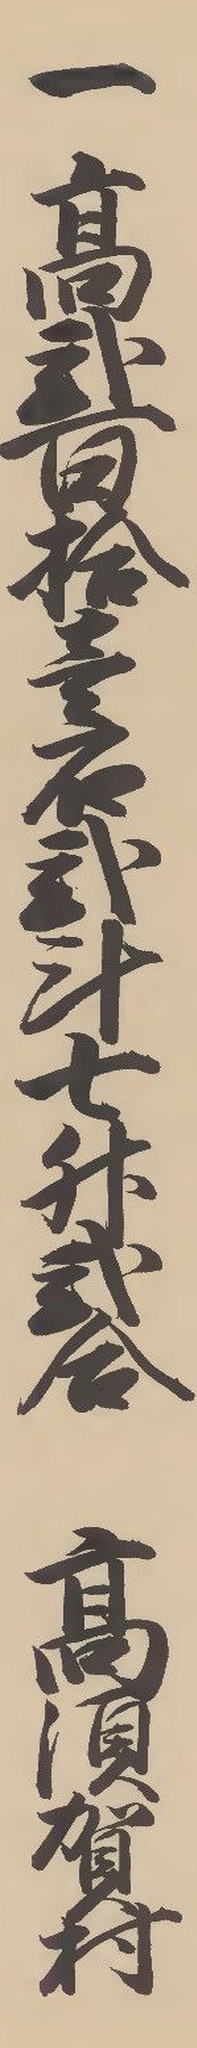一高弐百拾壱石弐斗七升弐合高須賀村
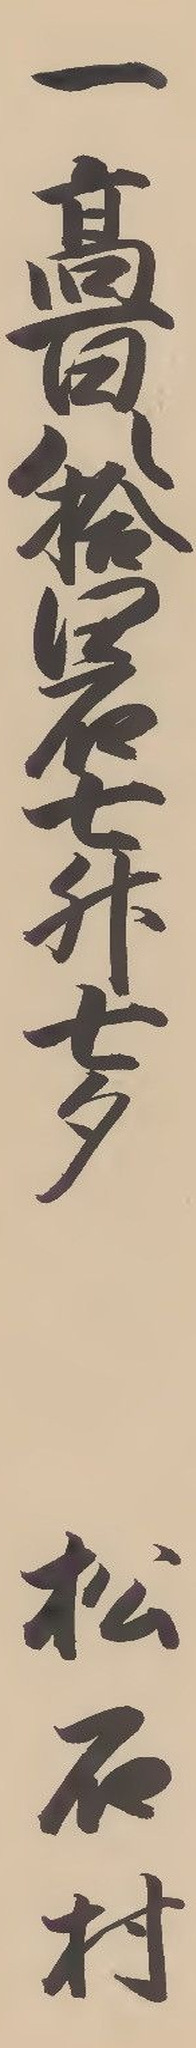一高百八拾四石七升七勺松石村

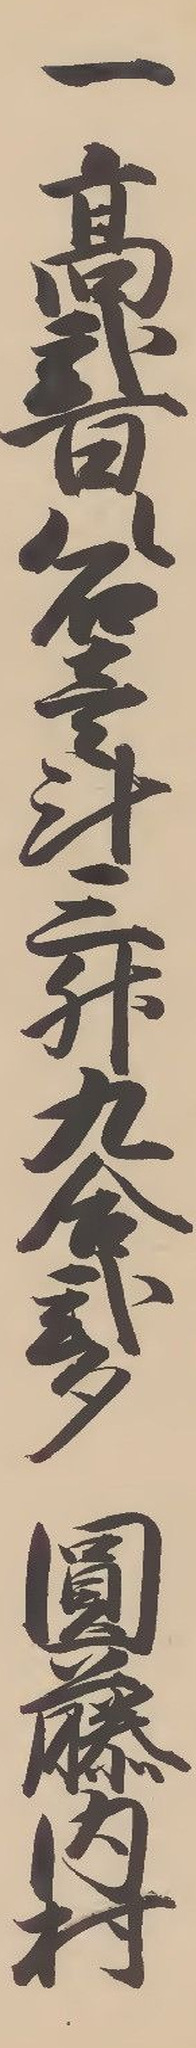一高弐百八石壱斗三升九合弐勺円藤内村
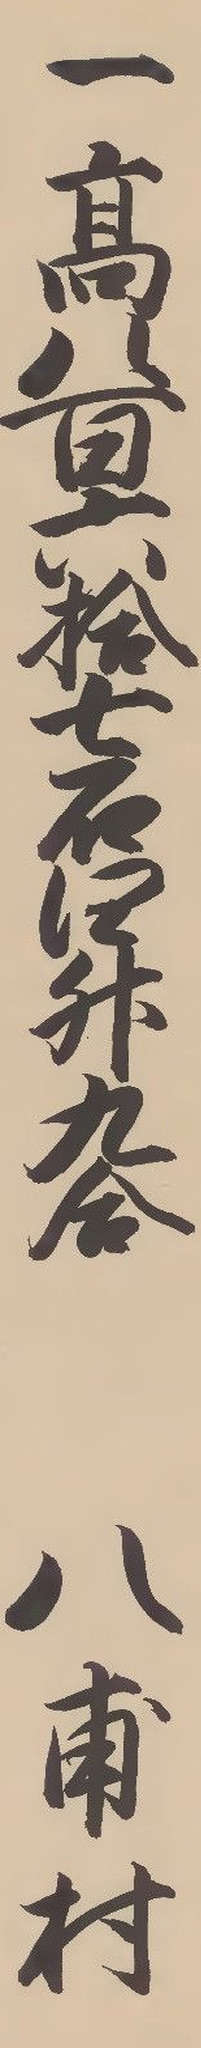一高八百六拾七石四升九合八甫村
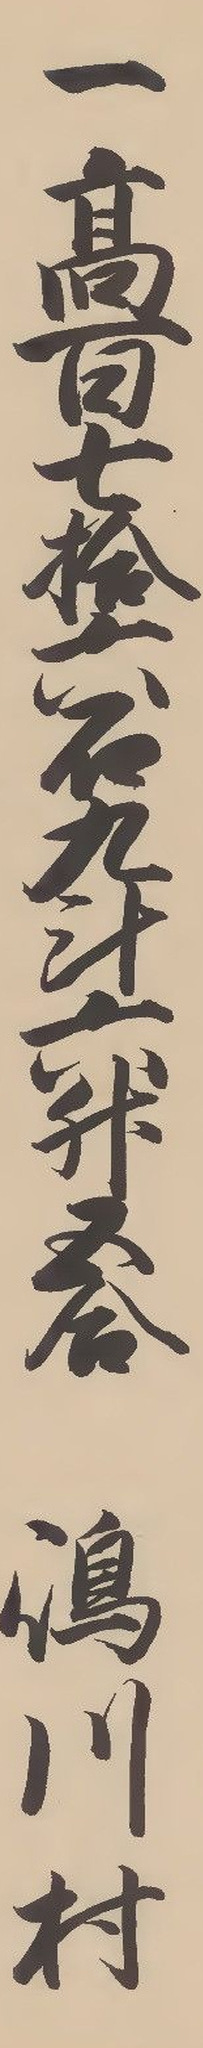一高百七拾六石九斗六升五合嶋川村
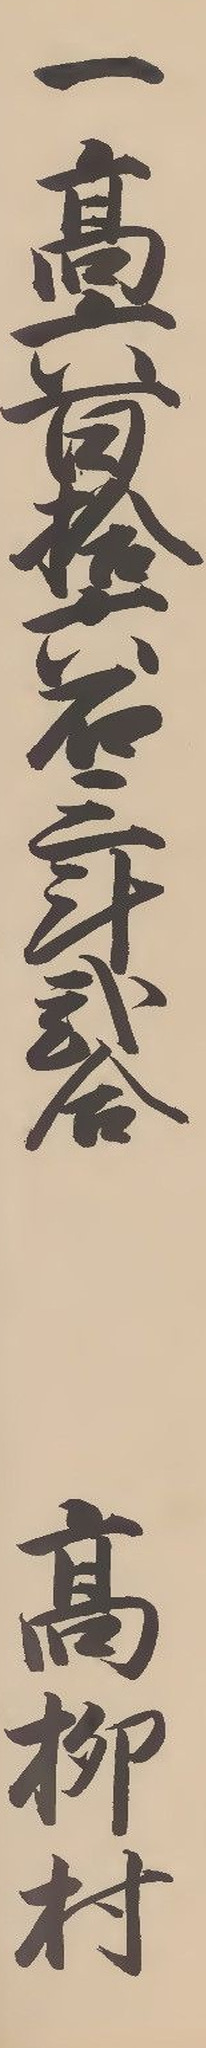一高六百拾六石三斗弐合高柳村
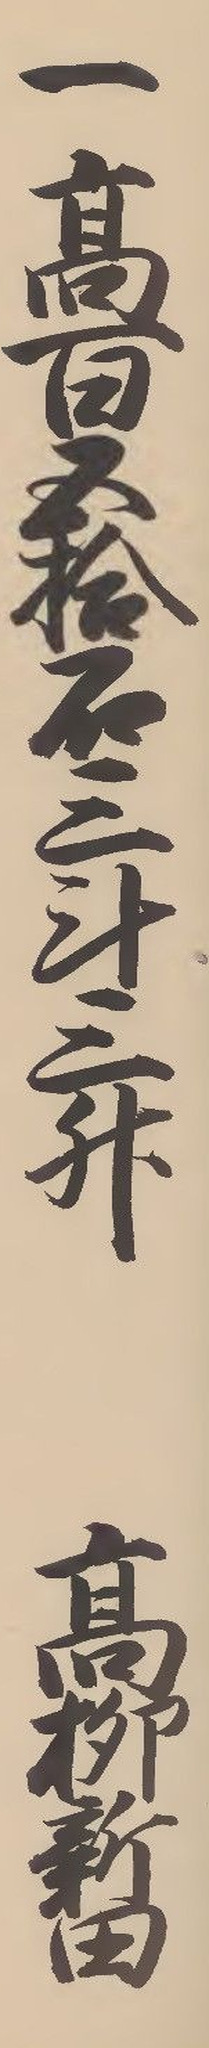一高百五拾石三斗三升高柳新田
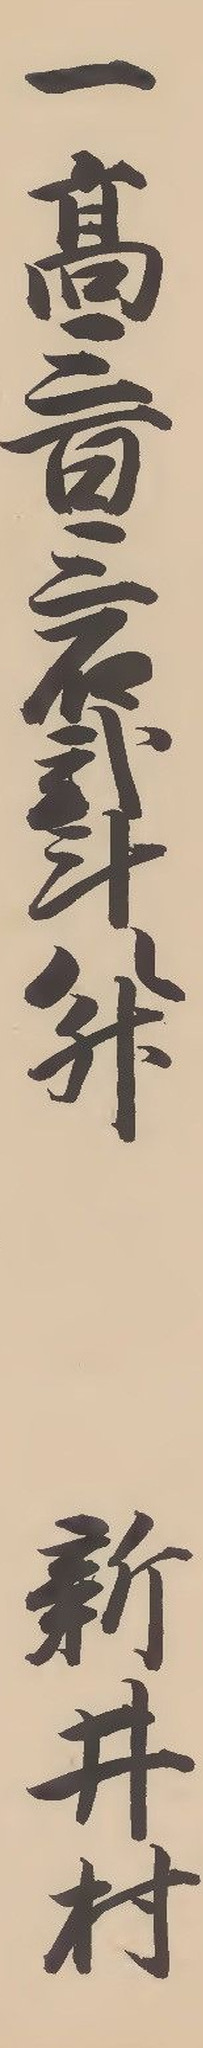一高三百三石弐斗八升新井村
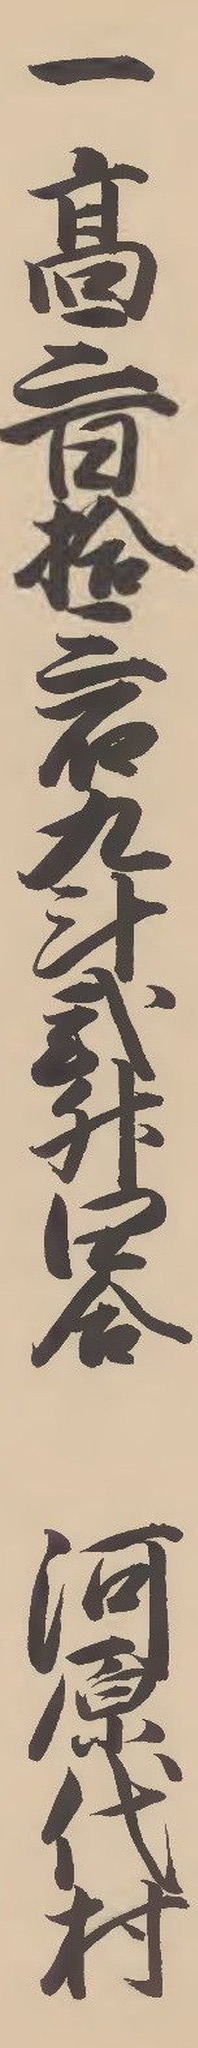一高三百拾三石九斗弐升四合河原代村
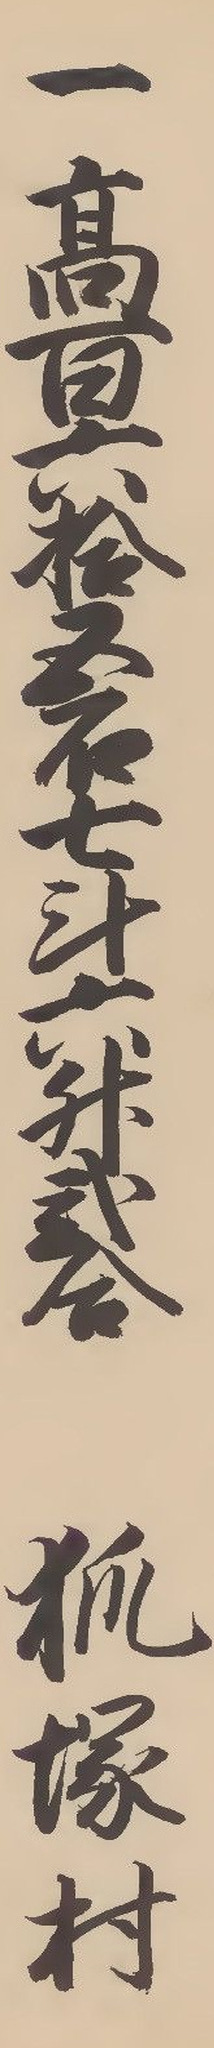一高百六拾五石七斗六升弐合狐塚村

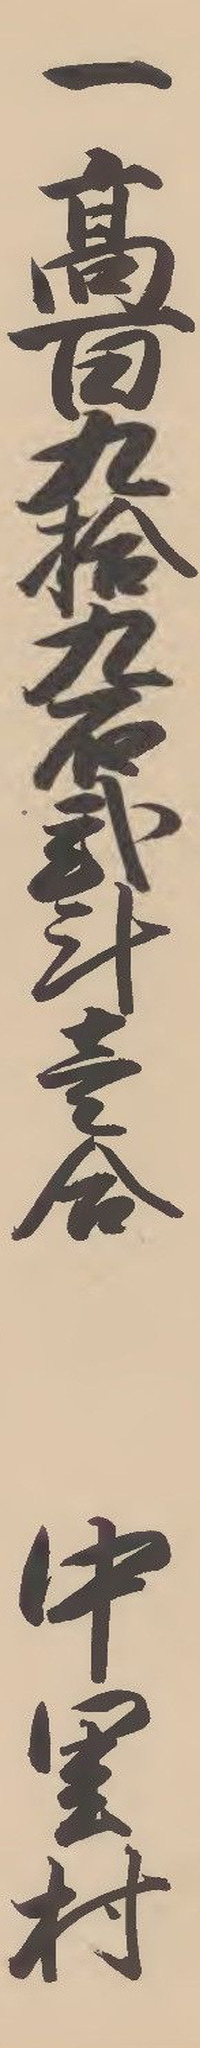一高百九拾九石弐斗壱合中里村
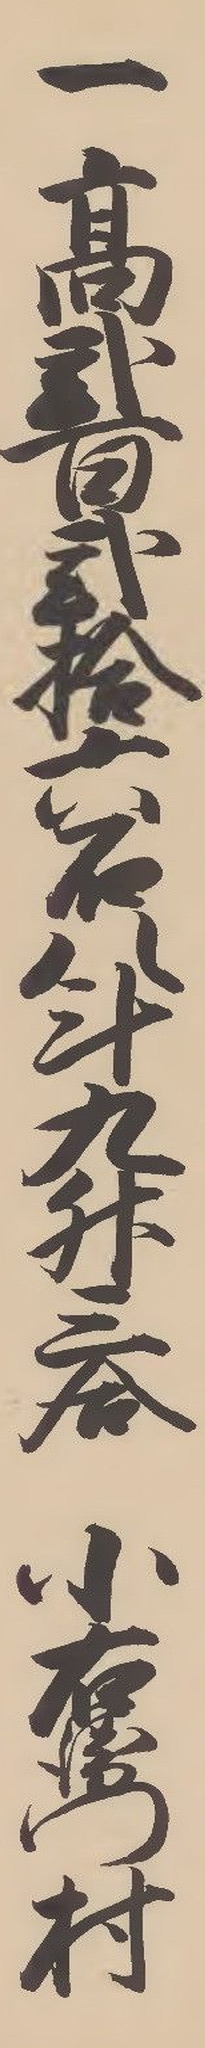一高弐百弐拾六石八斗九升三合小右衛門村
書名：武蔵国郷帳　下
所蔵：国立公文書館 National Archives of Japan
